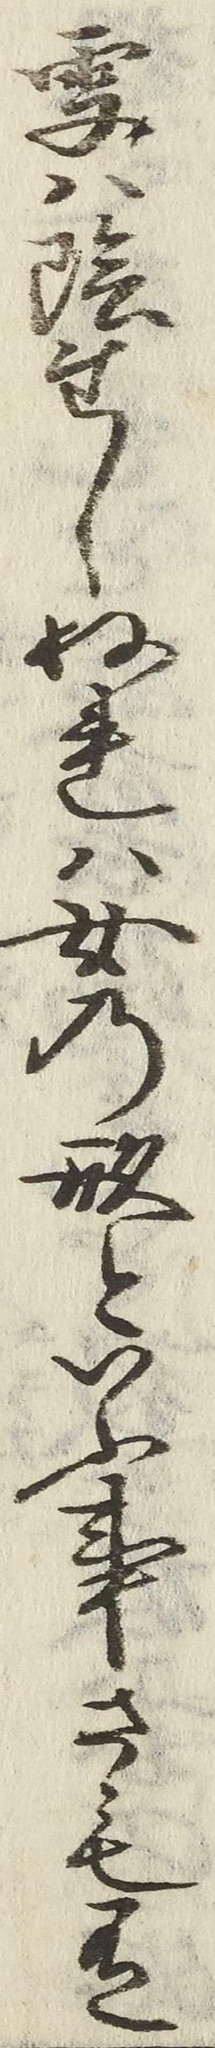雪は陰生しぬれは女の形といふ事さも有
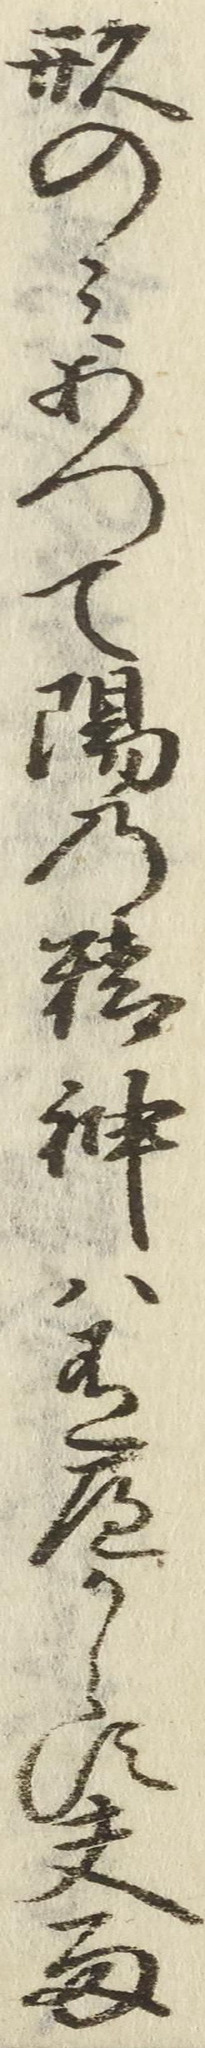形のみあつて陽の精神は有へからす夫雨

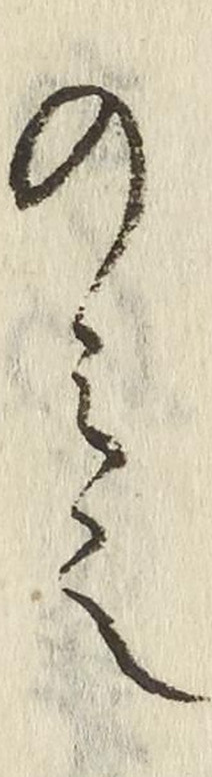のみ也
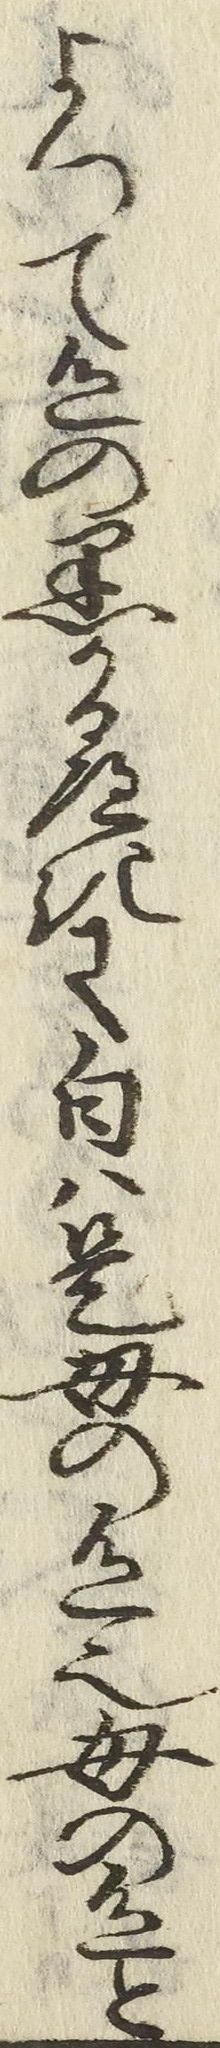よつて色の黒かるべきに白は是母の色なり母の色と
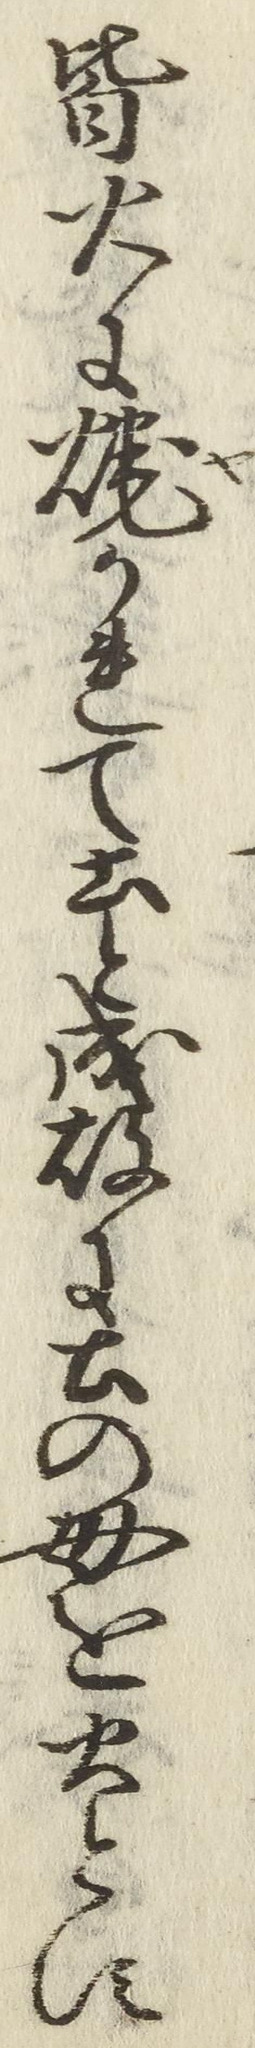皆火に焼ヤかれて土と成故に土の母を火とす
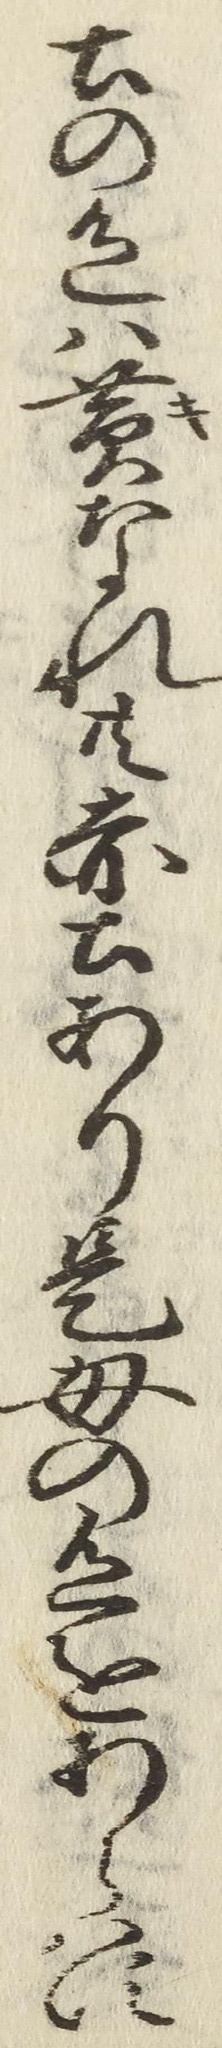土の色は黄キなれ共赤土あり是母の色をあらはす
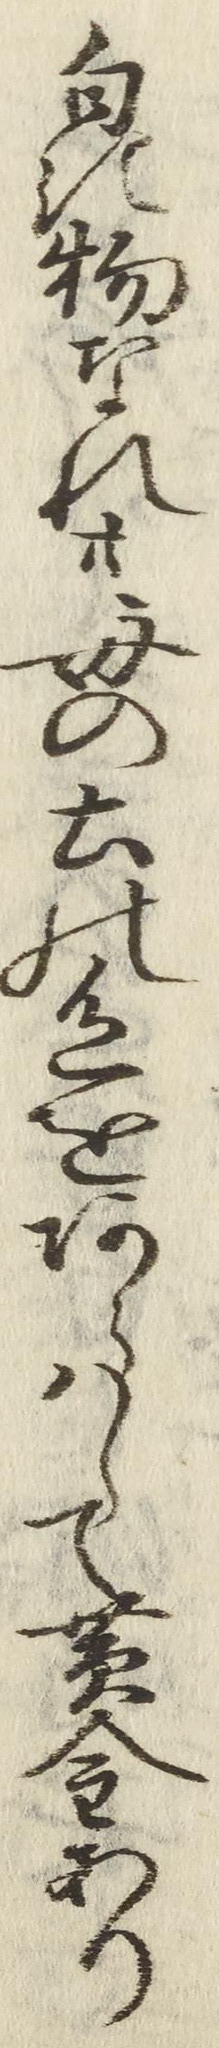白き物なれ共母の土の色をあらはして黄金あり
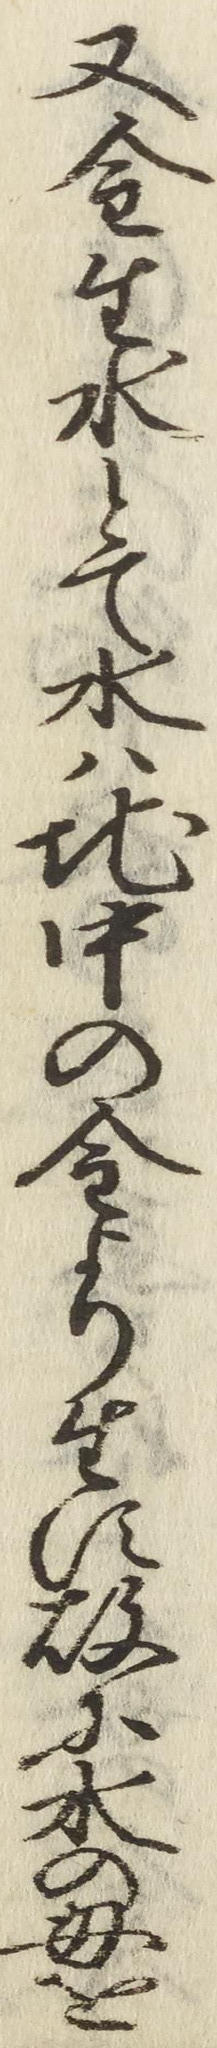又金生水とて水は地中の金より生す故に水の母を

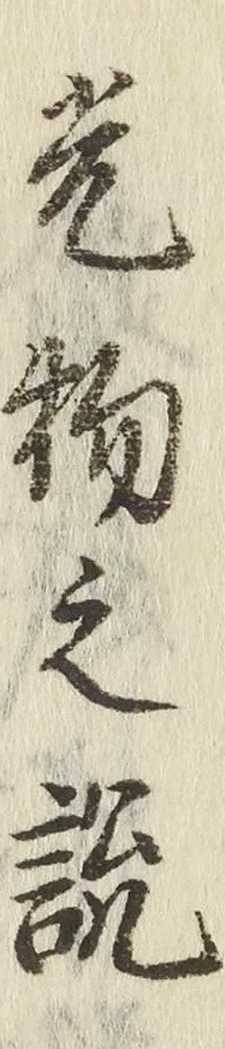光物之説

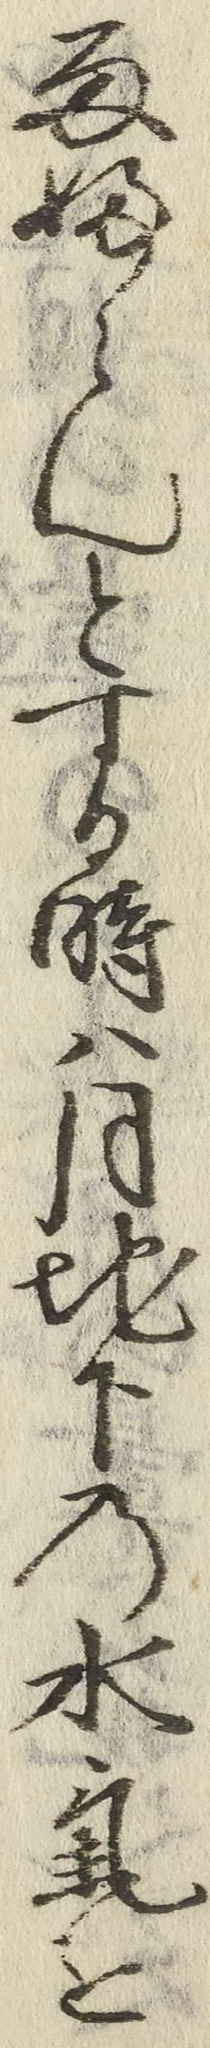雨ふらんとする時は月地下の水気を

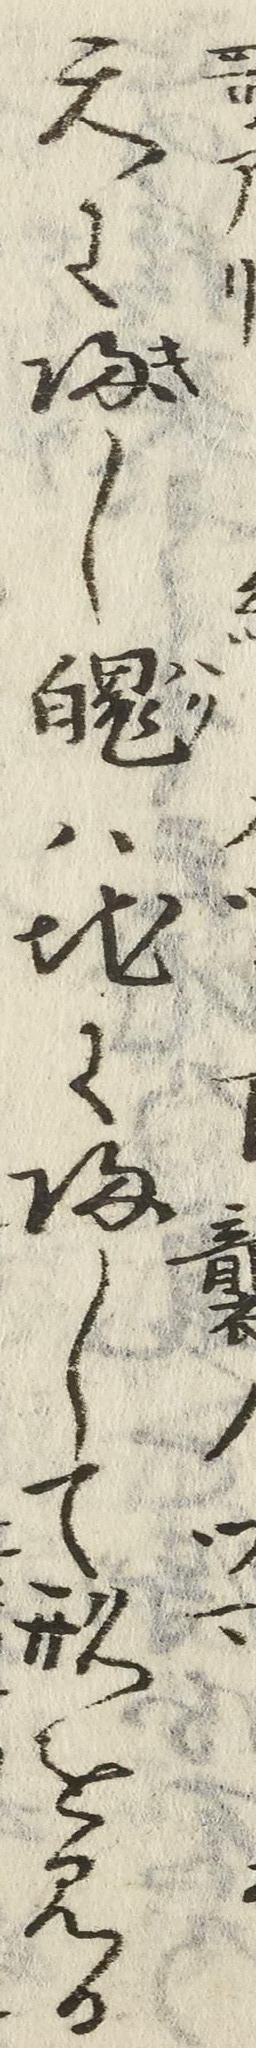天に帰し魄は地に帰して形を見る
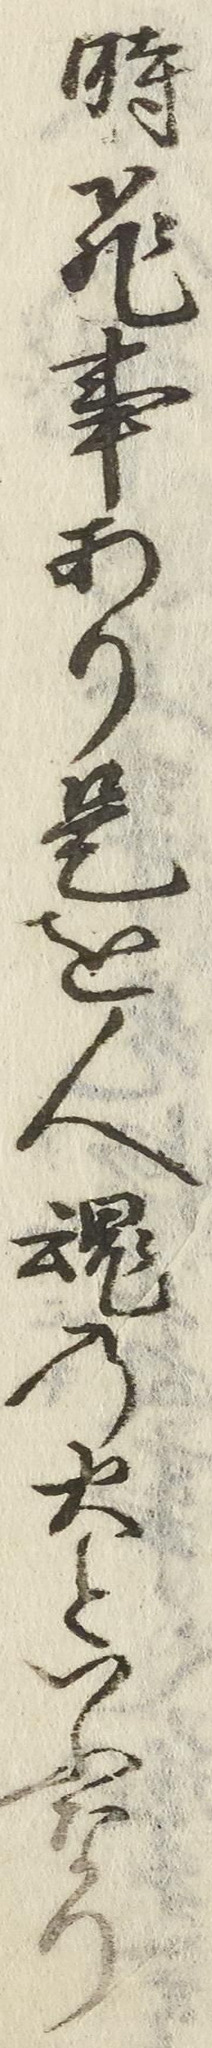時飛事あり是を人魂の火といふなり

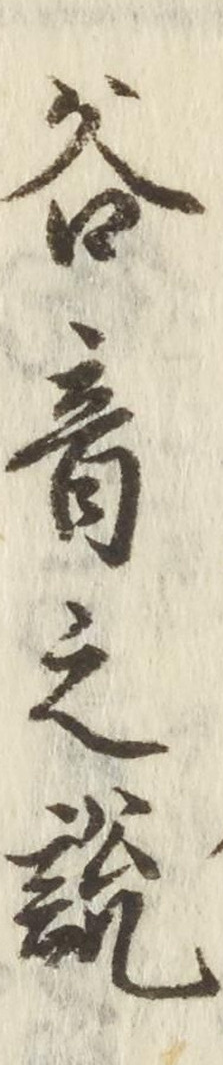谷音之説

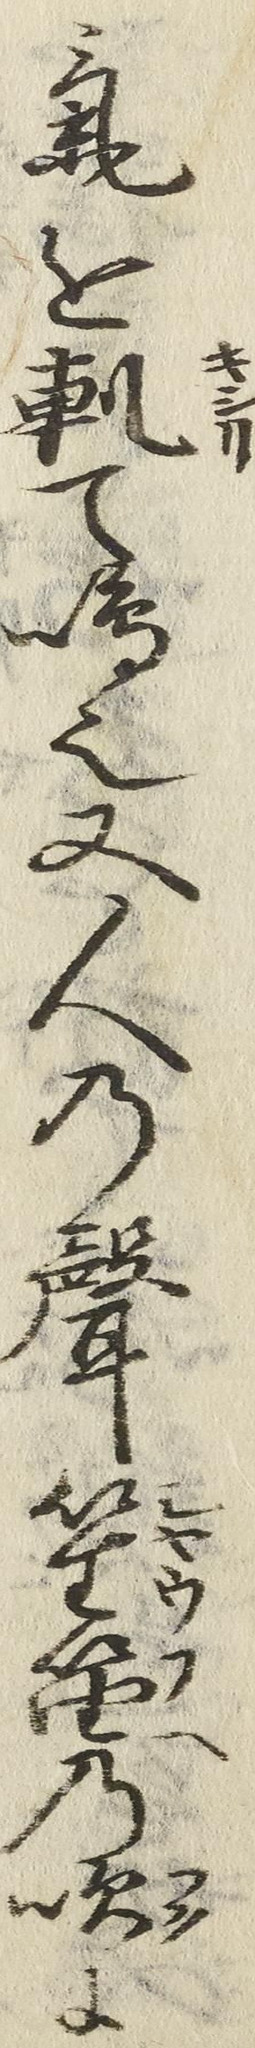気を軋て鳴也又人の声笙笛の吹に
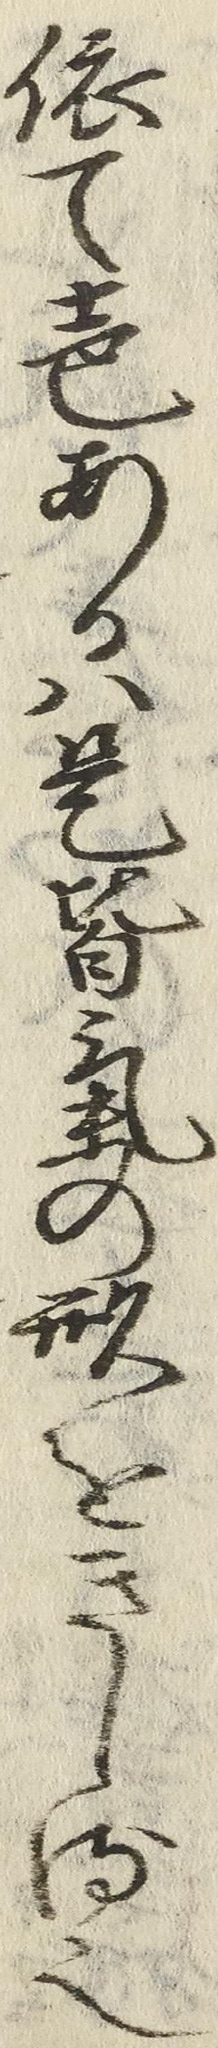依て声あるは是皆気の形をきしる也
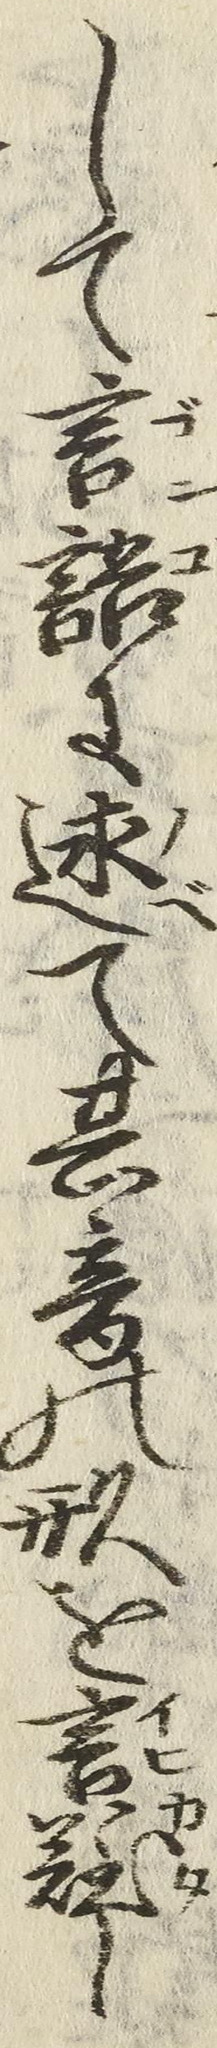して言語に述て其音の形を言難し
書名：天地或問珍　天
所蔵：東京大学地震研究所図書室 Earthquake Research Institute Library, The University of Tokyo, JAPAN
